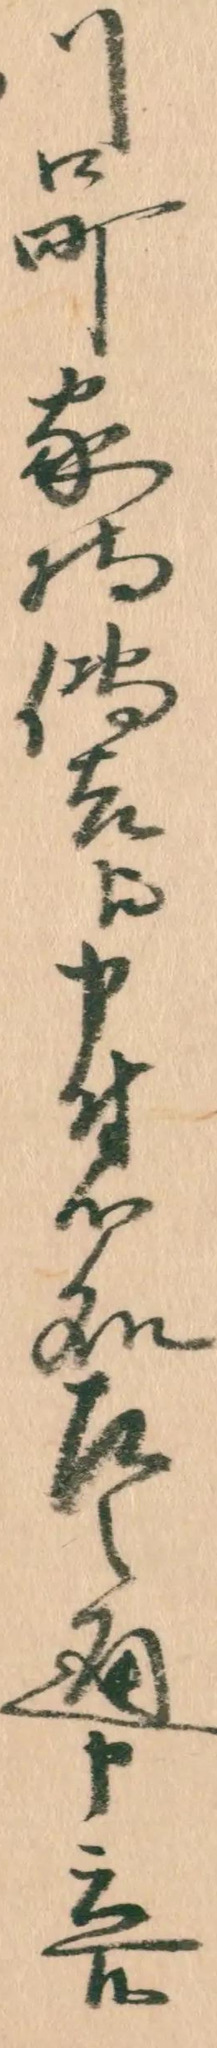川口町家持伝吉え申付候処左之通申立候
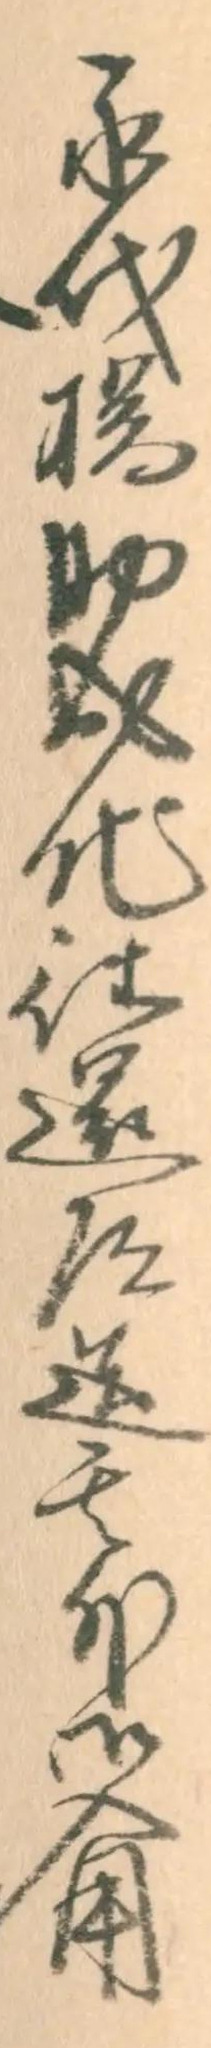永代橋助成地往還道造其外御入用
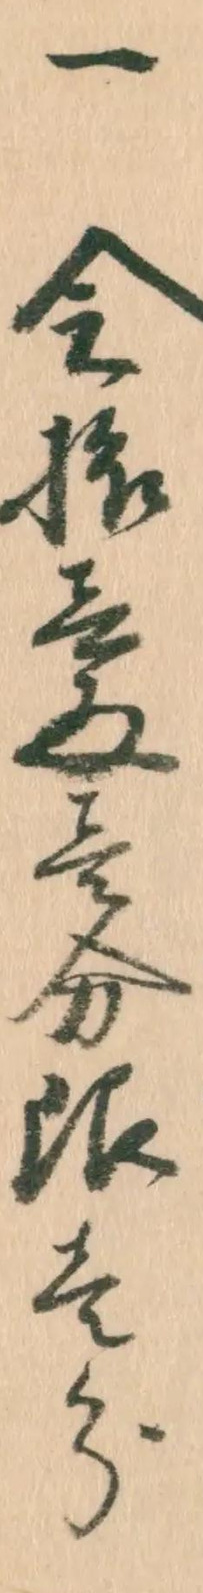一金拾壱両壱分銀壱分
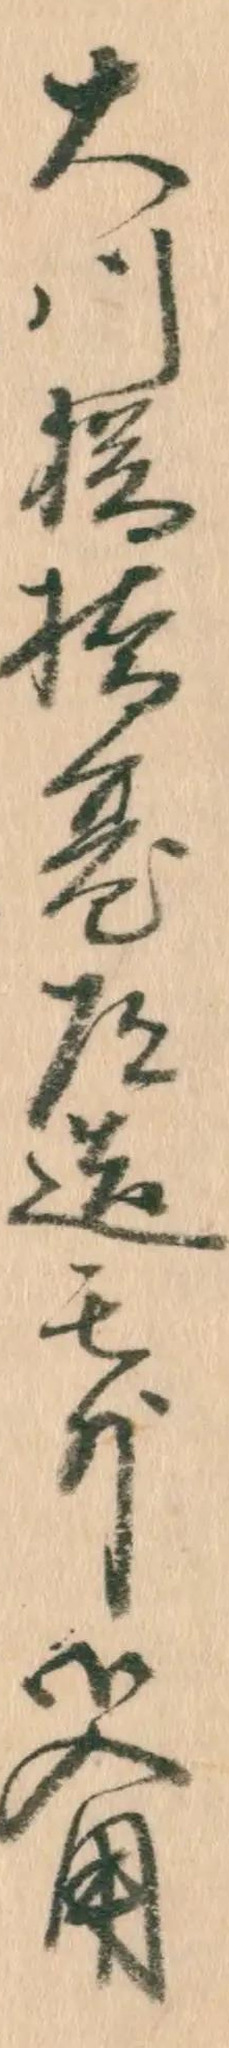大川橋橋台道造其外御入用
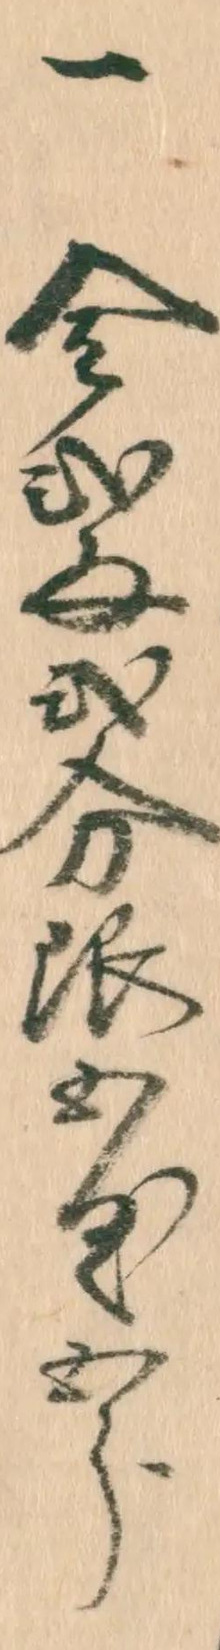一金弐両弐分銀五匁五分
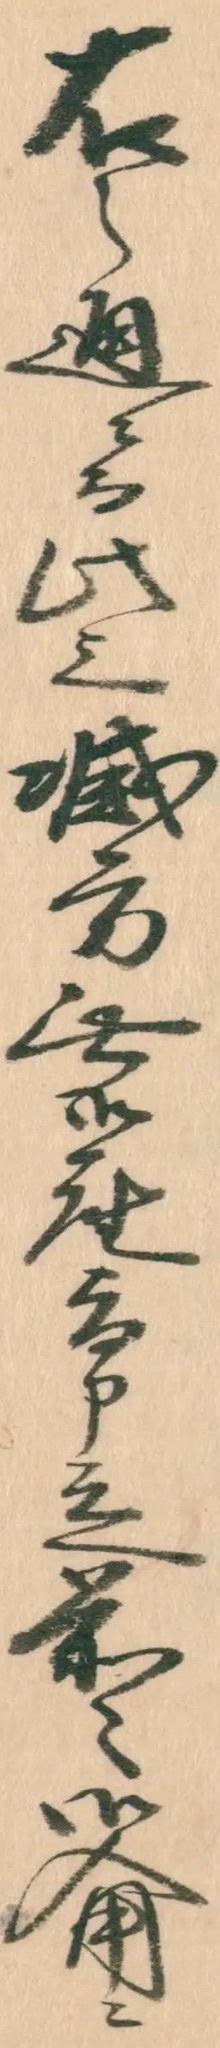右之通ニ而此上減方無御座旨申立前々御入用ニ
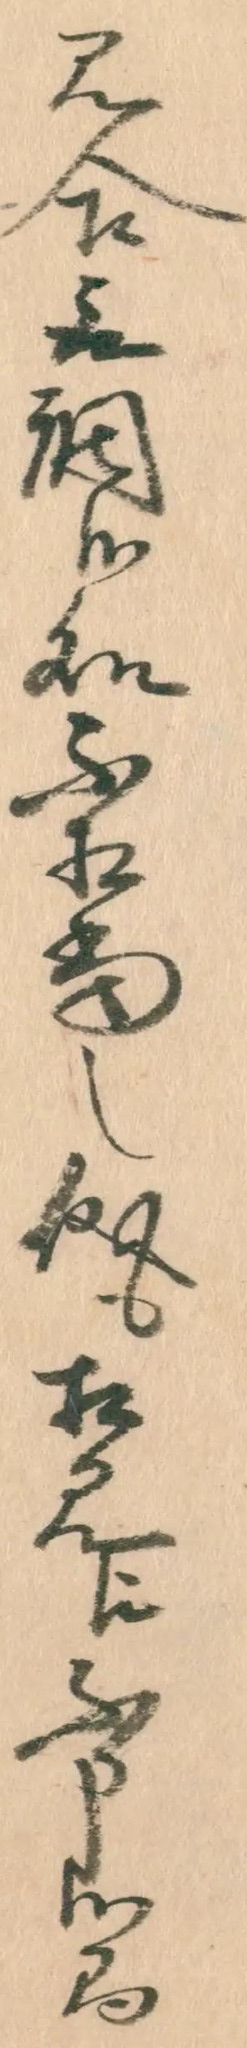見合取調候処不相当之儀も相見え不申候間
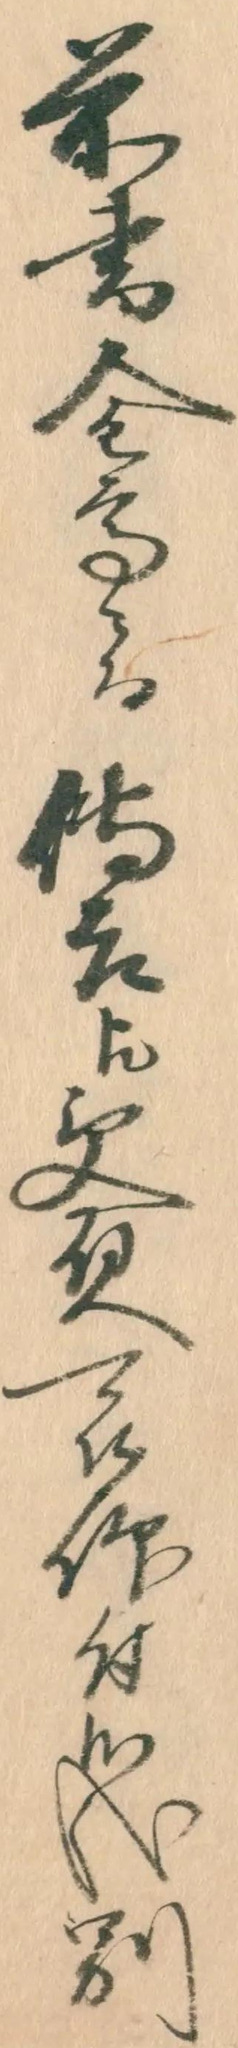前書金高ニ而伝吉え受負可被仰付候哉別

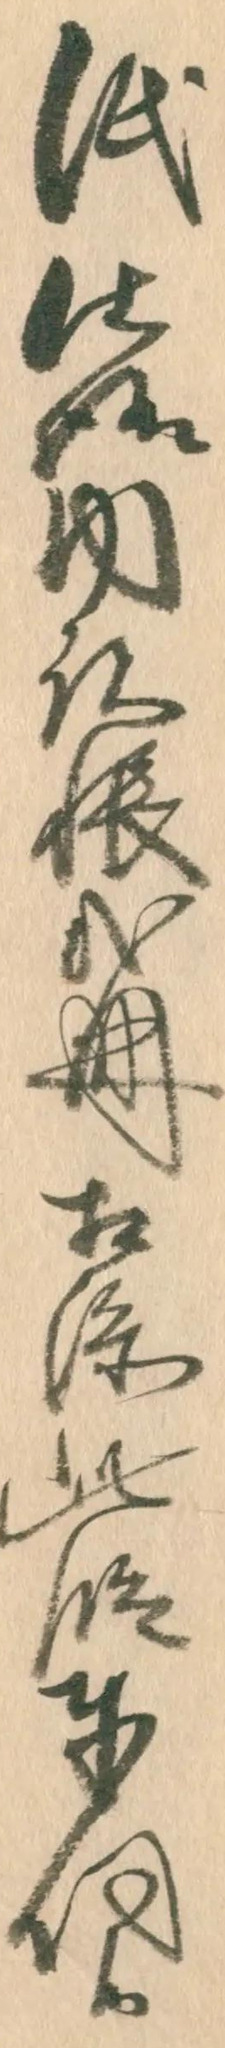紙仕様内訳帳弐冊相添此段奉伺候
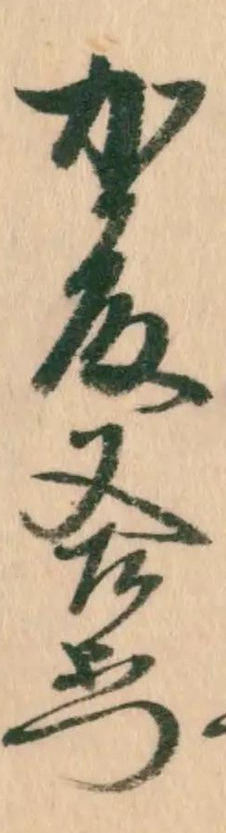加藤又左衛門
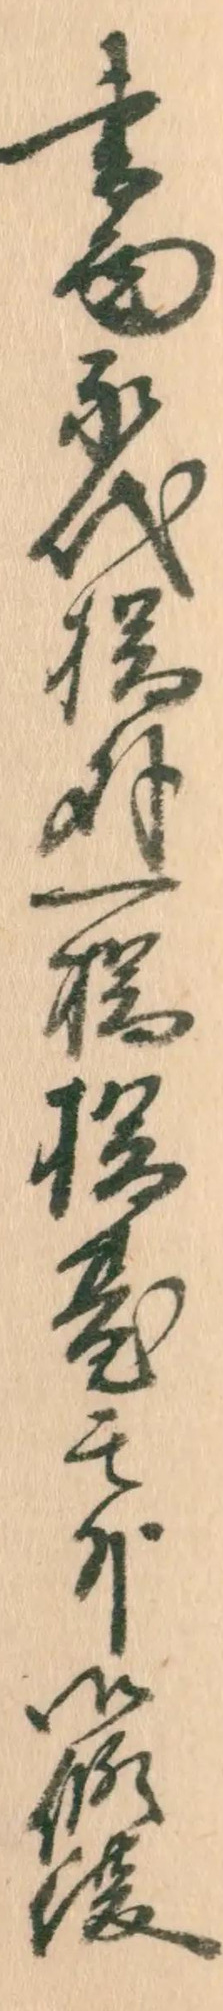書面永代橋外一橋橋台其外御修復
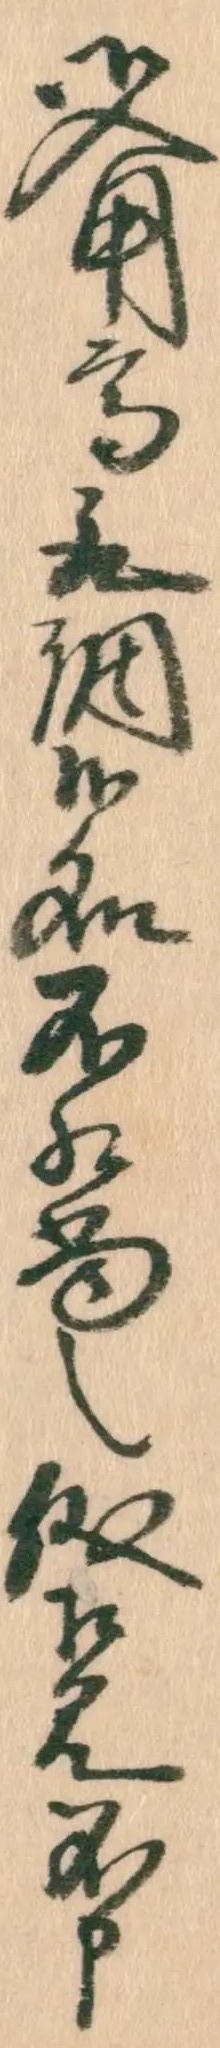御入用高取調候処不相当之儀相見不申
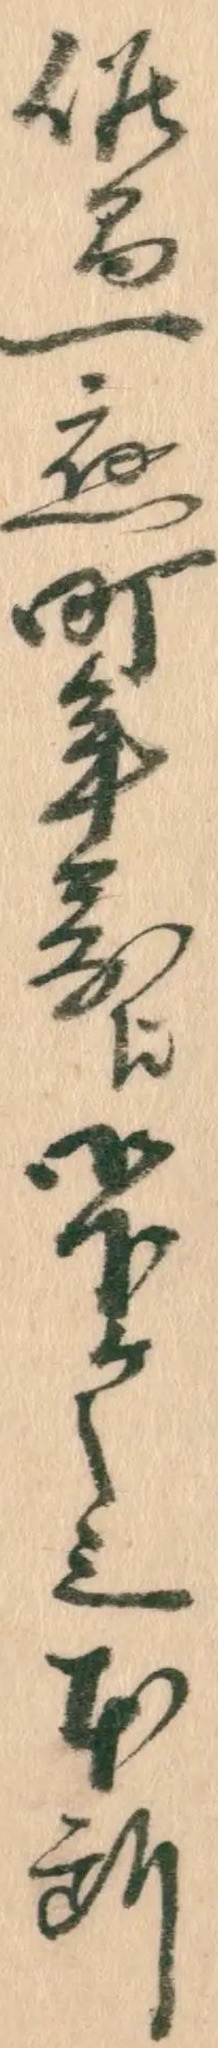候間一応町年寄え御下ケ之上本所
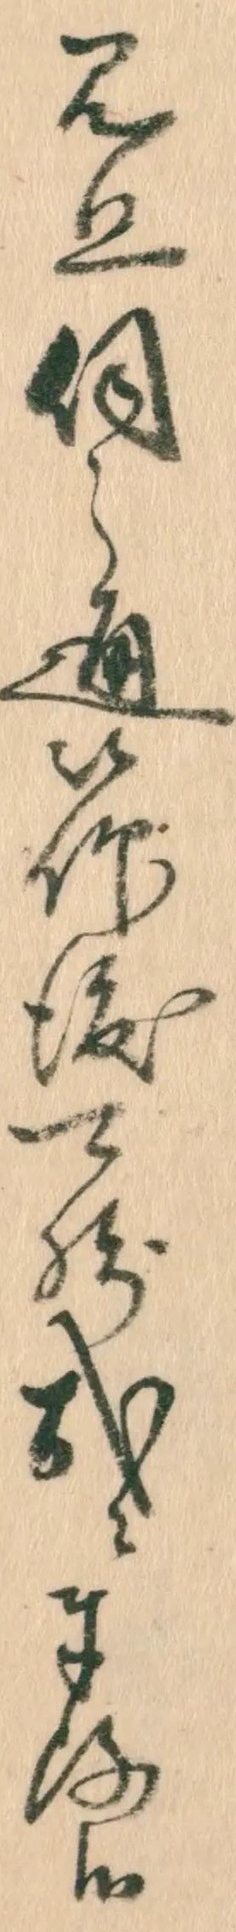見廻伺之通被仰渡可然哉ニ奉存候
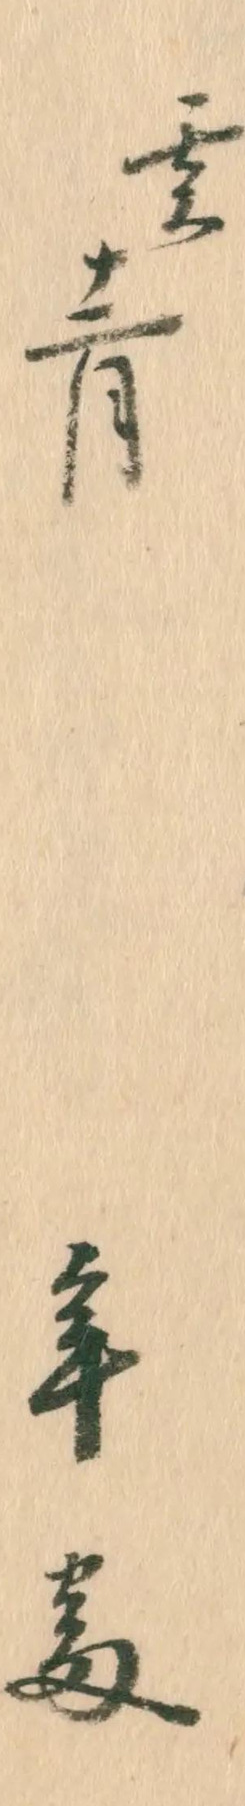亥十二月年番

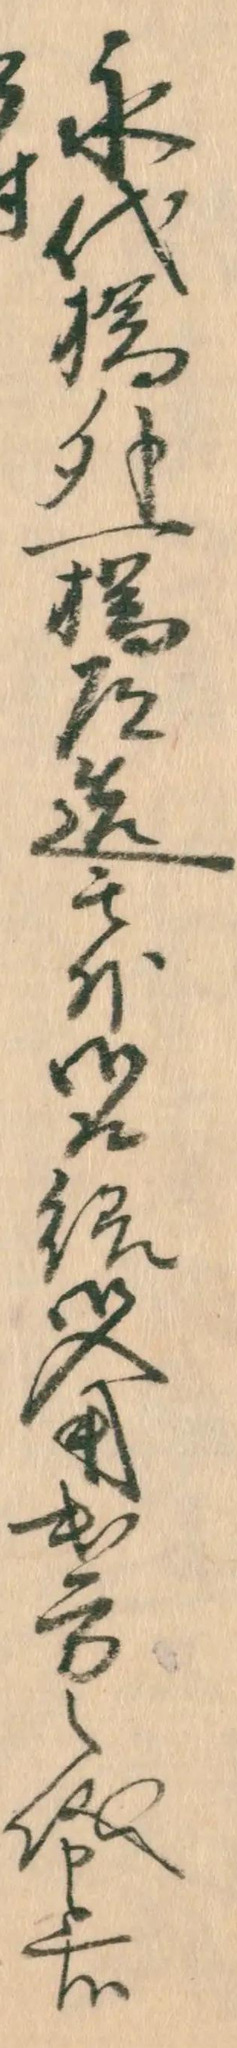永代橋外一橋道造其外御取繕御入用出方之儀申上候
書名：三橋 17巻. [7] 三橋小破御修復書留　但御奉行御掛リ替地震潰橋番屋　嘉永四亥年より安政二卯年迄　上
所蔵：国立国会図書館 National Diet Library, JAPAN
